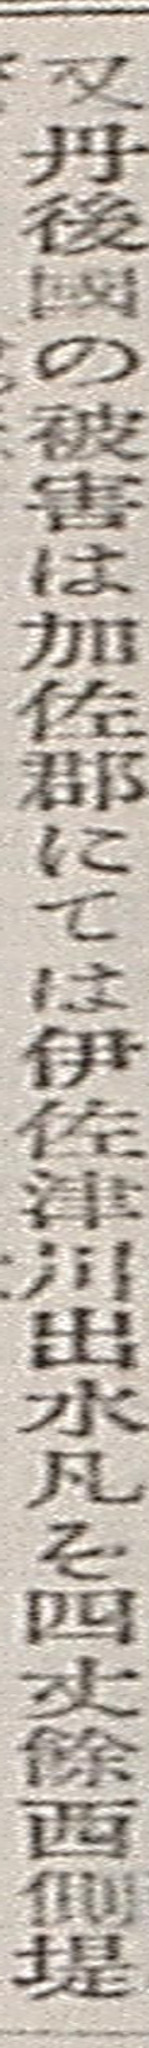又丹後国の被害は加佐郡にては伊佐津川出水凡そ四丈餘西側堤
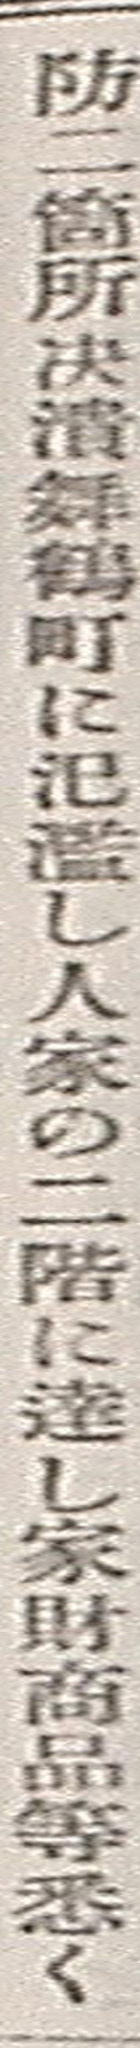防二箇所决潰舞鶴町に氾濫し人家の二階に達し家財商品等悉く
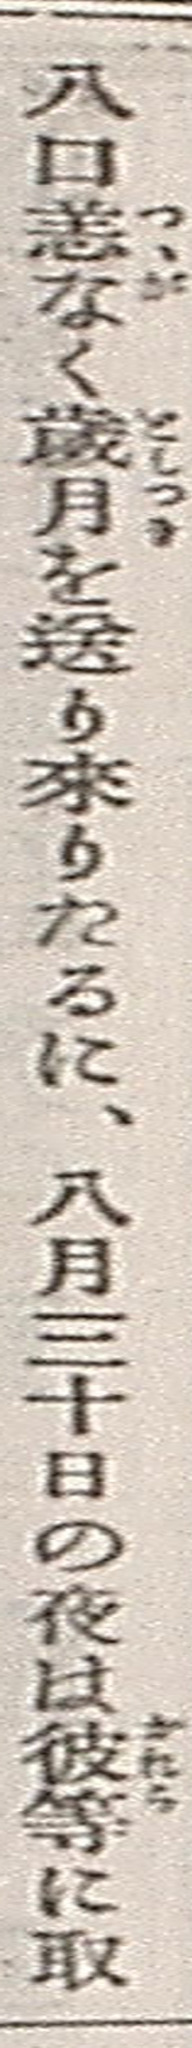八口恙なく歳月を送り来りたるに、八月三十日の夜は彼等に取
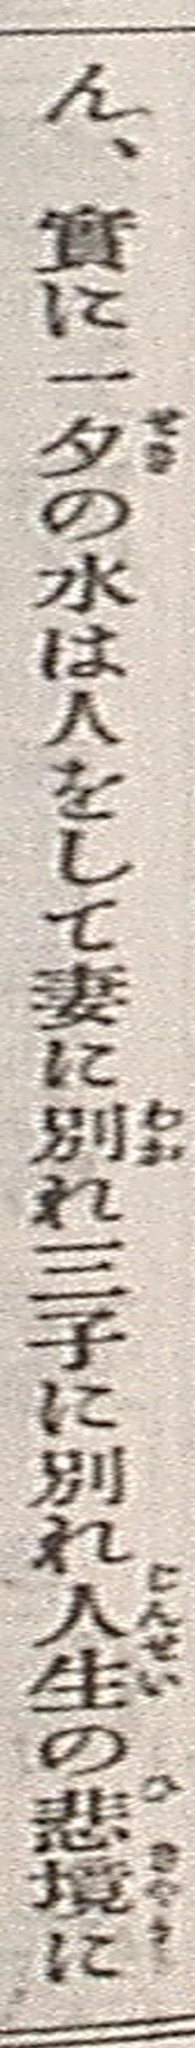ん、実に一夕の水は人をして妻に別れ三子に別れ人生の悲境に
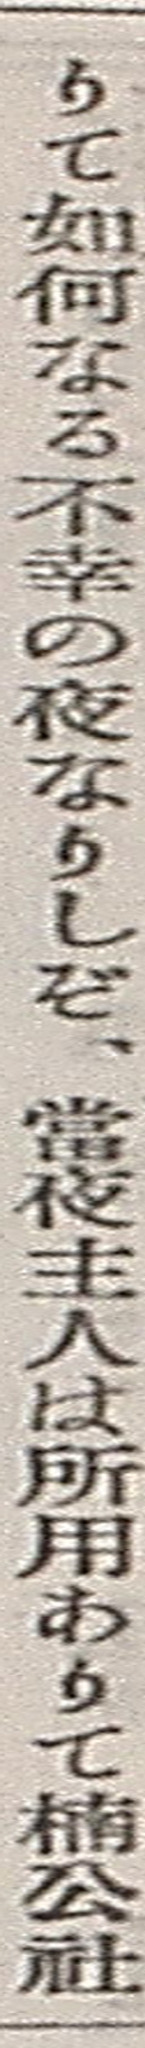りて如何なる不幸の夜なりしぞ、当夜主人は所用ありて楠公社
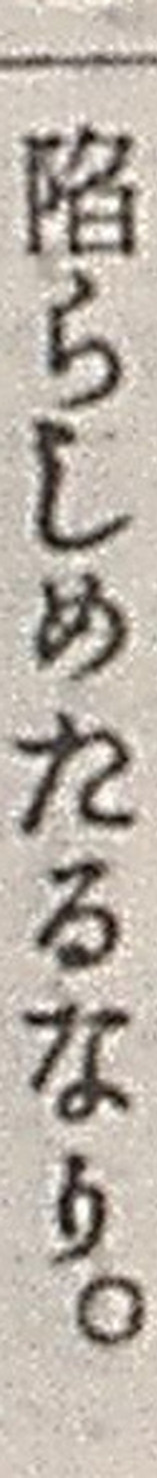陥らしめたるなり。
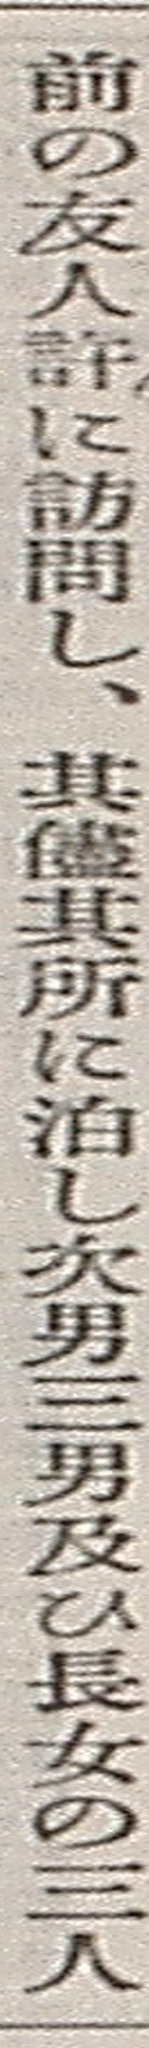前の友人許に訪問し、其儘其所に泊し次男三男及び長女の三人
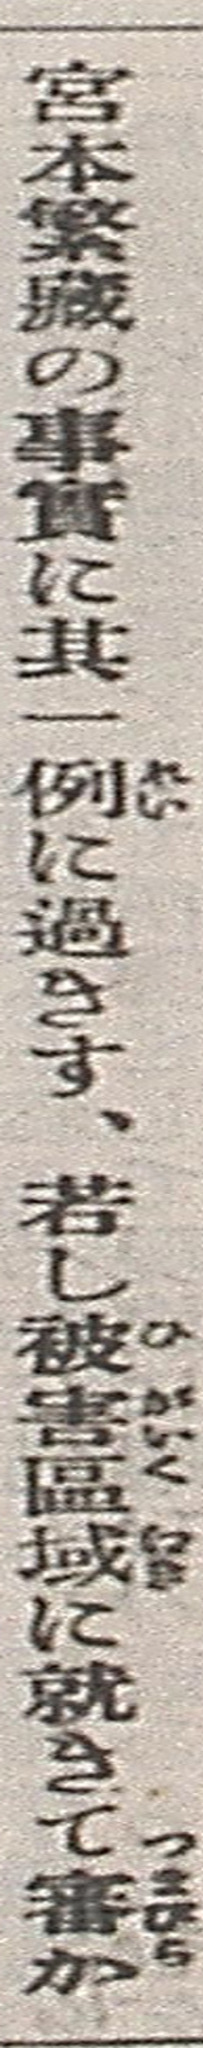宮本繁蔵の事実に其一例にに過ぎす、若し被害區域に就きて審か
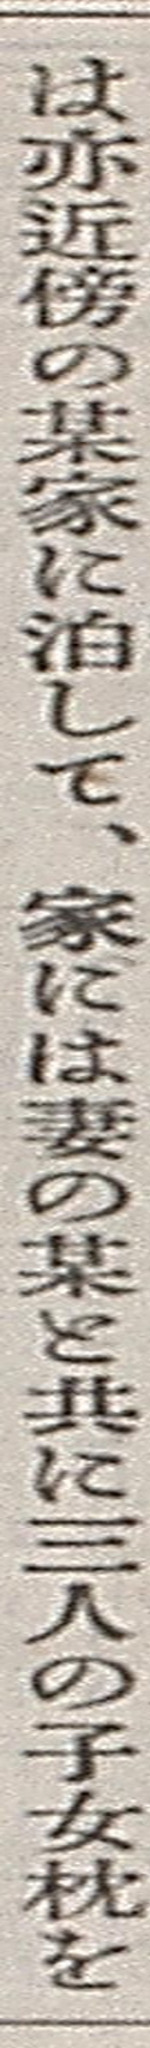は亦近傍の某家に泊して、家には妻の某と共に三人の子女枕を
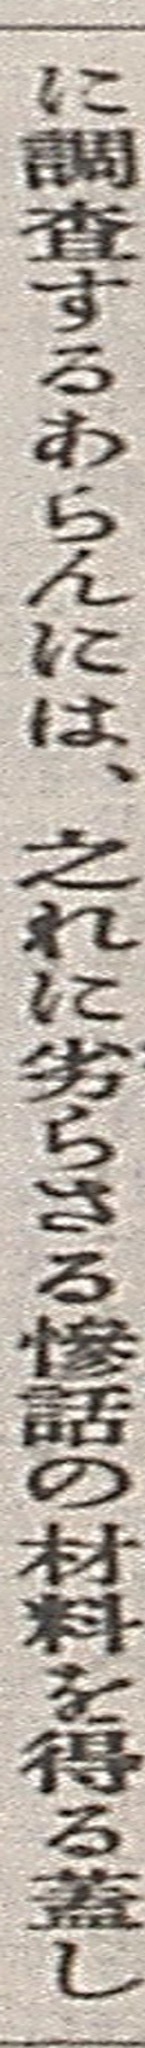に調査するあれらんには、之れに劣らさる惨話の材料を得る蓋し
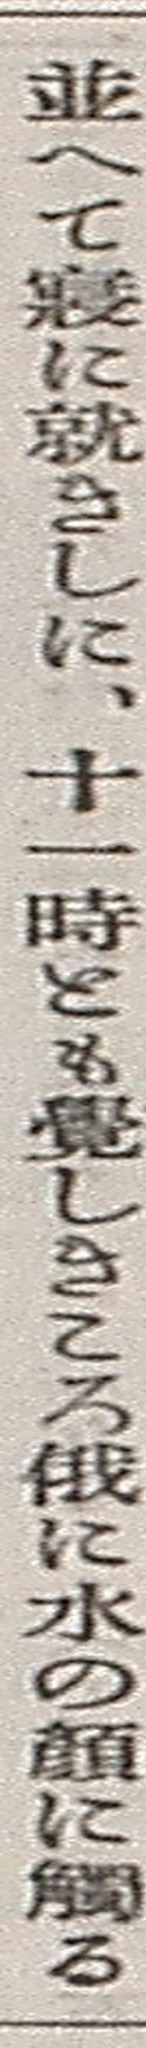並へて寝に就きしに、十一時とも覚しきころ俄に水の顔に觸る
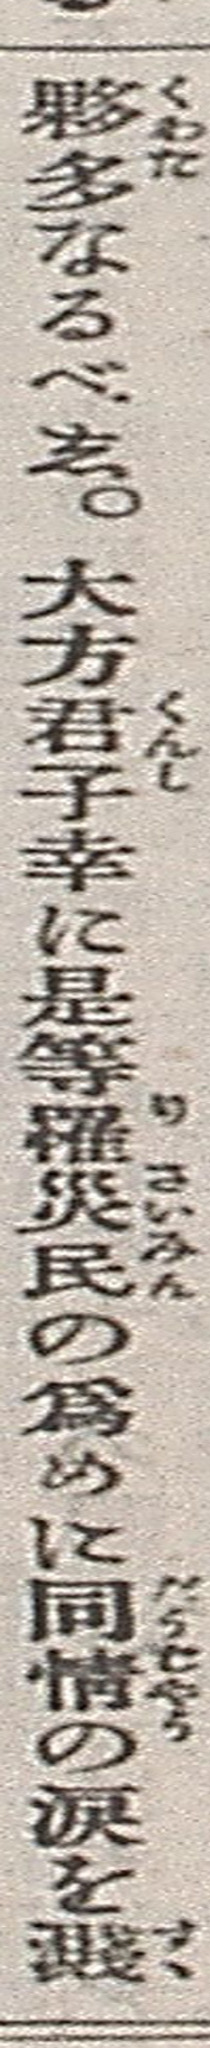夥多なるべし。大方君子幸に是等罹災民の為めに同情の涙を濺
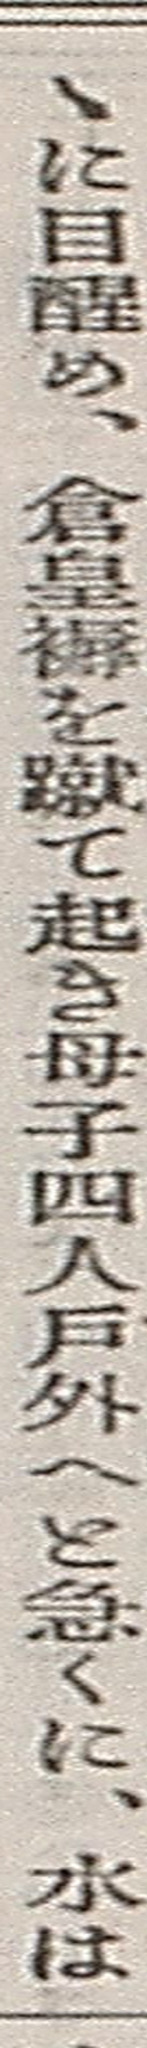ゝに目醒め、倉皇褥を蹴て起き母子四人戸外へと急ぐに、水は
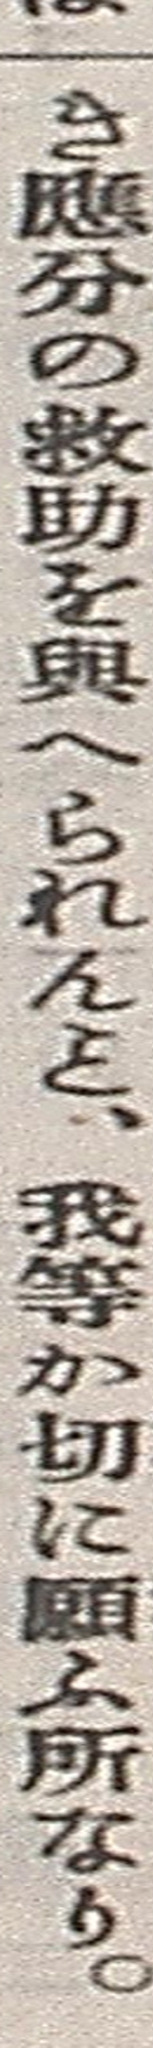き応分の救助を與へられんこと、我等か切に願ふ所なり
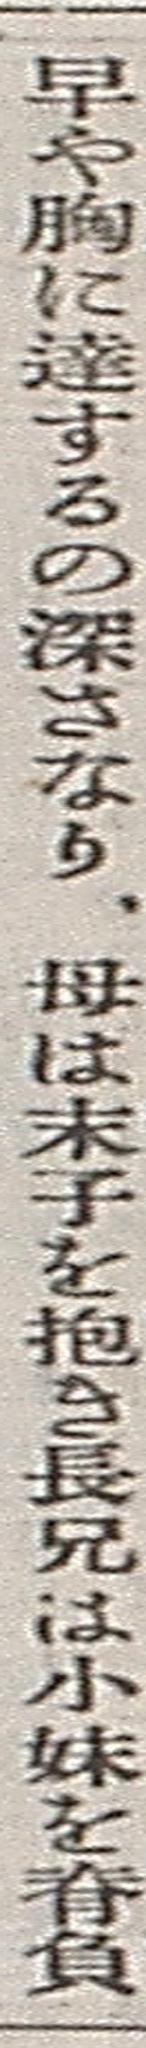早や胸に達するの深さなり、母は末子を抱き長兄は小妹を背負
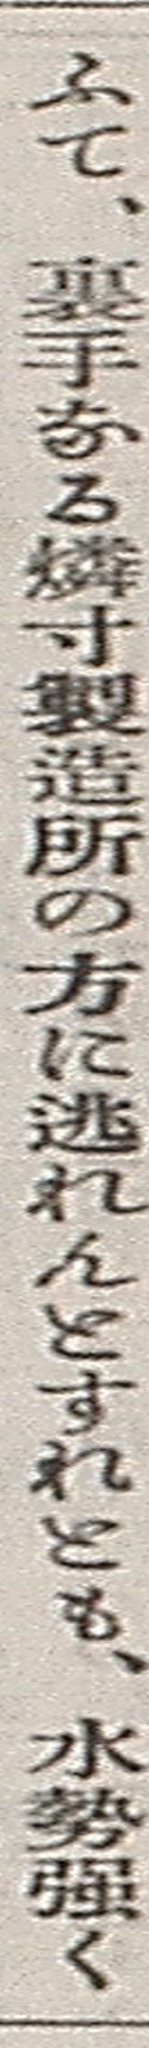ふて、裏手なる燐寸製造所の方に逃れんとすれとも、水勢強く
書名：風俗畫報臨時増刊第百二十六號　洪水被害録（中）
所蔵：東京大学地震研究所図書室 Earthquake Research Institute Library, The University of Tokyo, JAPAN
